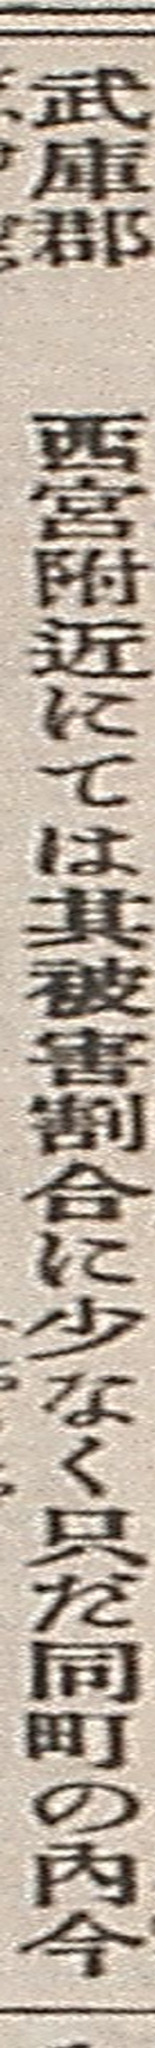武庫郡西宮附近にては其被害割合に少なく只だ同町の内今
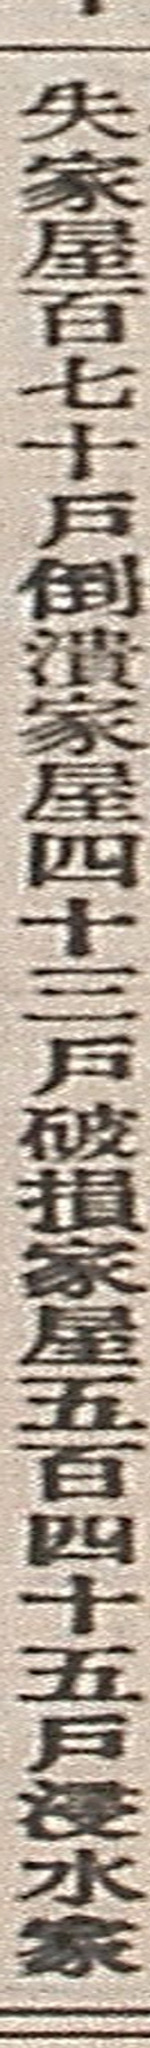失家屋百七十戸倒潰家屋四十三戸破損家屋五百四十五戸浸水家
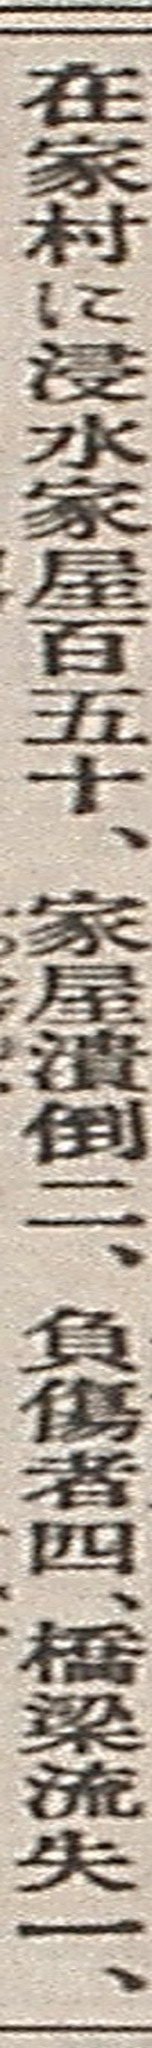在家村に浸水家屋百五十、家屋潰倒二、負傷者四、橋梁流失一、
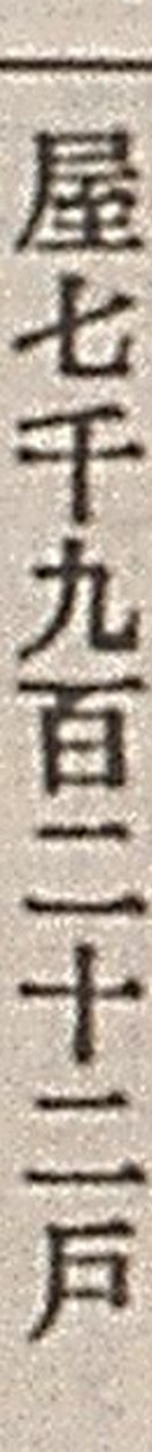屋七千九百二十二戸
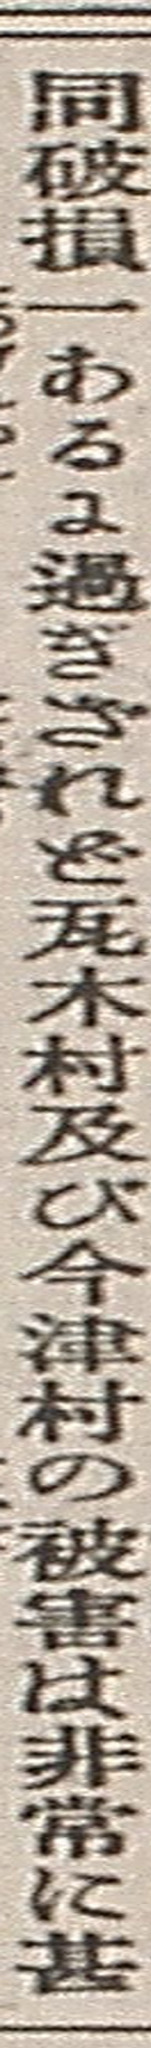同破損一あるに過ぎざれど瓦木村及び今津村の被害は非常に甚
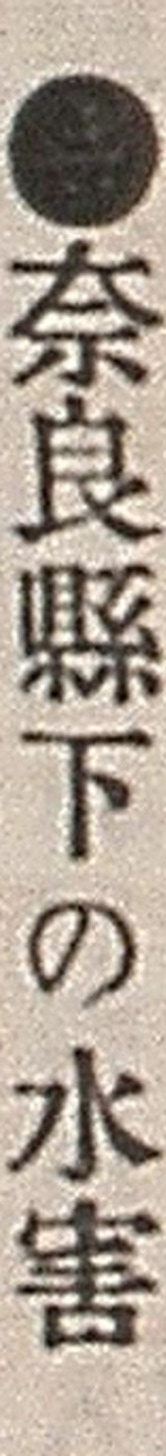●奈良県下の水害
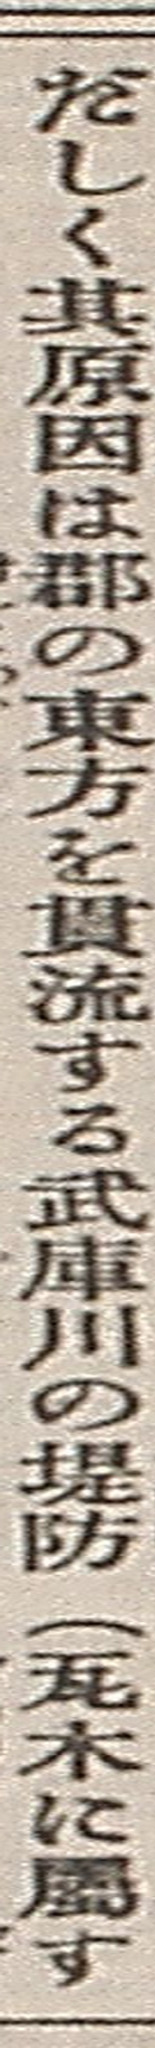だしく其原因は郡の東方を貫流する武庫川の堤防（瓦木に属す
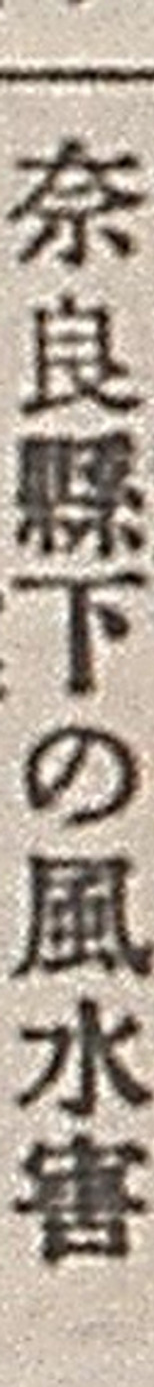●奈良県下の水害
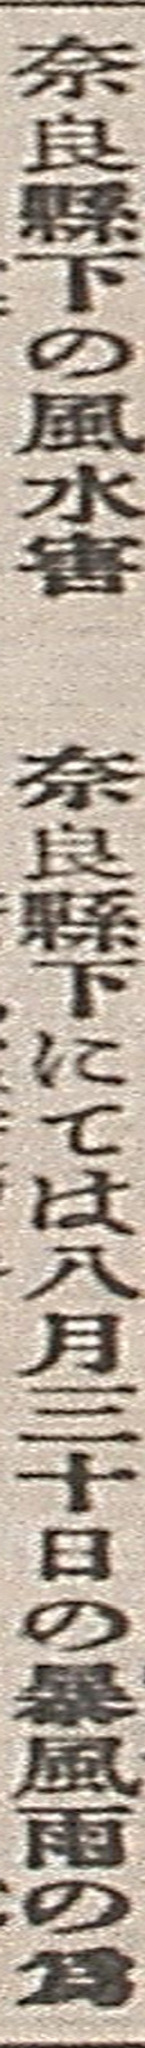奈良県下の風水害奈良県下にては八月三十日の暴雨風の為
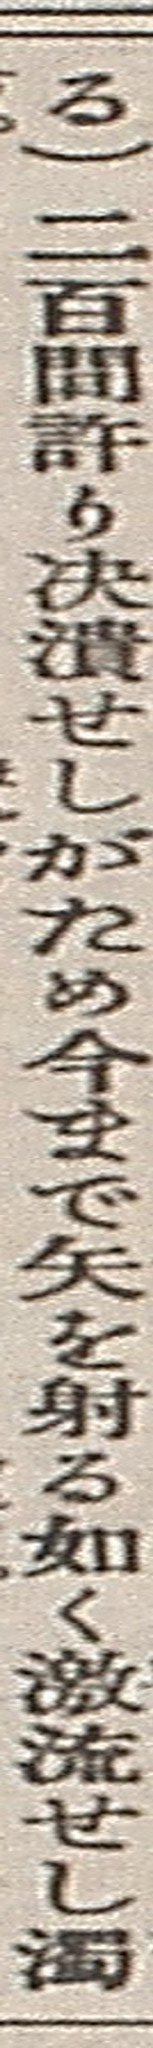る）二百間許り决潰せしがため今まで矢を射るが如く激流せし濁
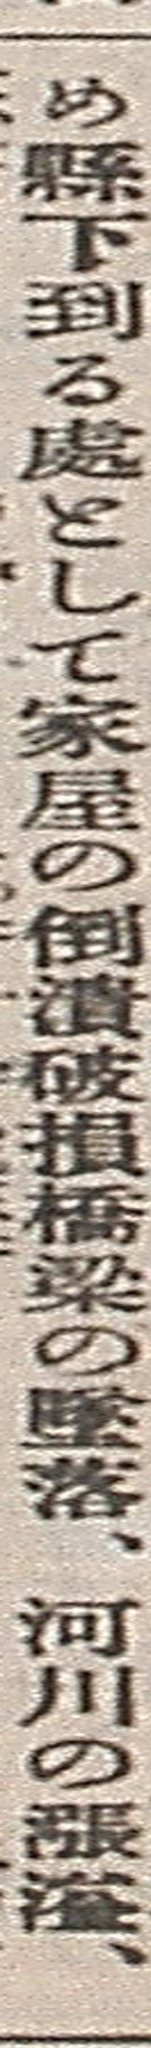め県下到る処として家屋の倒潰破損橋梁の墜落、河川の漲溢、
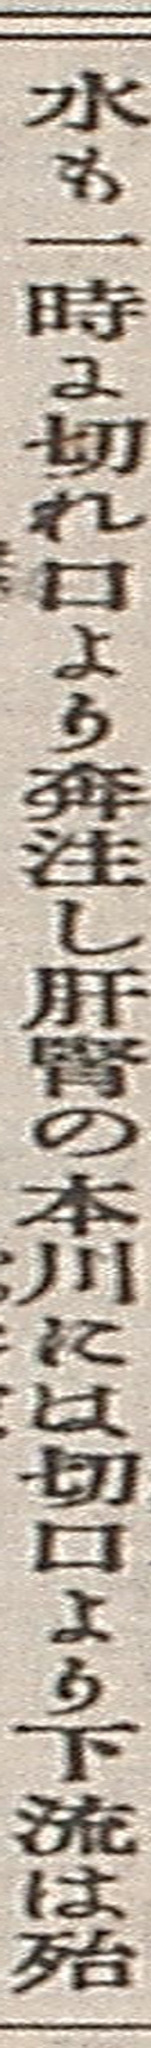水も一時に切れ口より渀注し肝腎の本川には切口より下流は殆
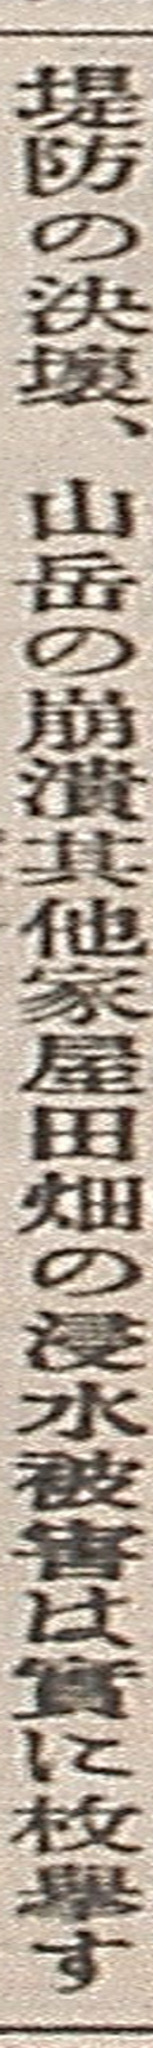堤防の決壊、山岳の崩潰其他家屋田畑の浸水被害は実に枚挙す
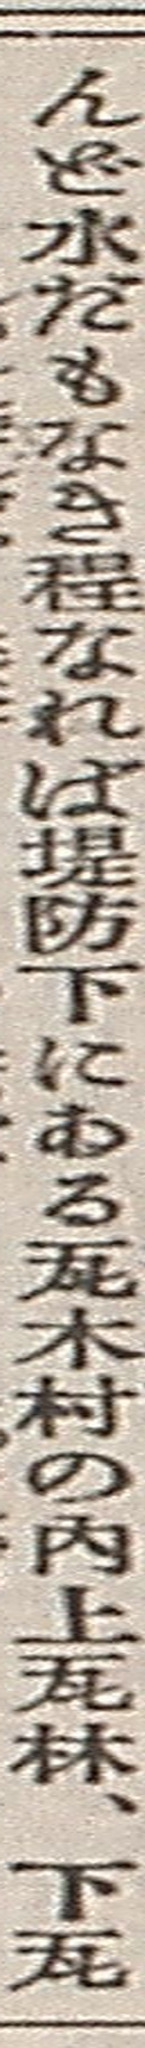んど水だもなき程なれば堤防下にある瓦木村の内上瓦林、下瓦
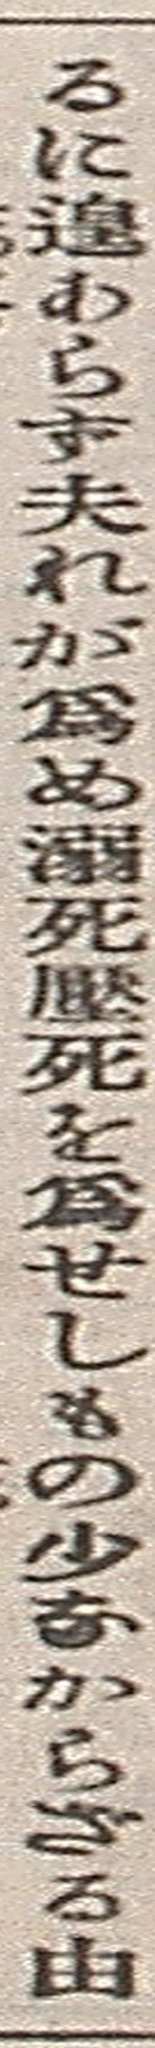るに遑あらず夫れが為め溺死壓死えお為せしもの少なからざる由
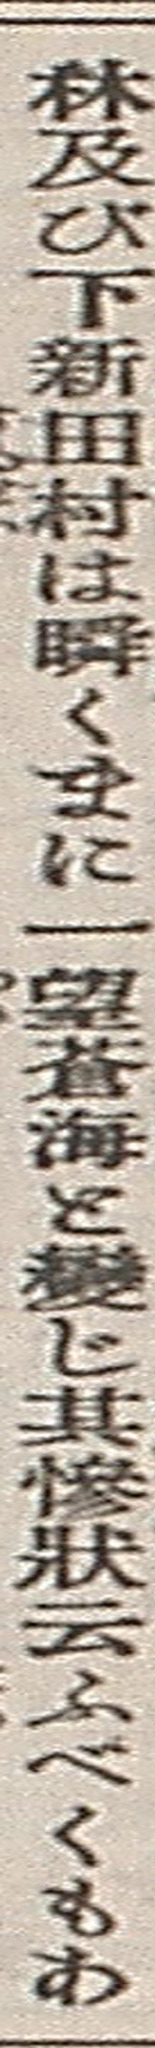林及び下新田村は瞬くまに一望蒼海と変じ其惨状云ふべくもあ
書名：風俗畫報臨時増刊第百二十八號　洪水被害録（下）
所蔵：東京大学地震研究所図書室 Earthquake Research Institute Library, The University of Tokyo, JAPAN
